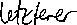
letzterer
